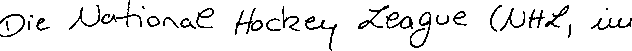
Die National Hockey League (NHL, im
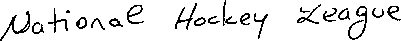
National Hockey League
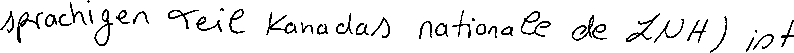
sprachigen Teil Kanadas nationale de LNH) ist
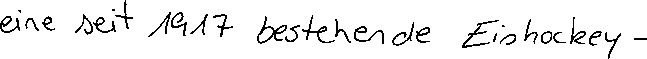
eine seit 1917 bestehende Eishockey-
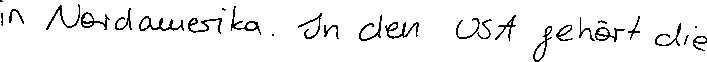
in Nordamerika. In den USA gehört die
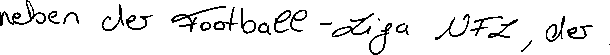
neben der Football-Liga NFL, der
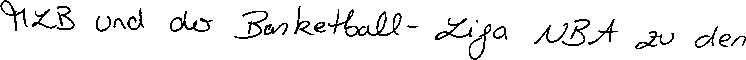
MLB und der Basketball-Liga NBA zu den
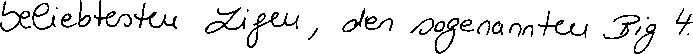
beliebtesten Ligen, den sogenannten Big 4.
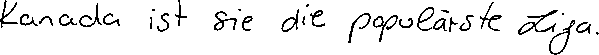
Kanada ist sie die populärste Liga.
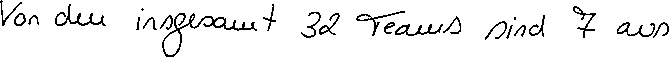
Von den insgesamt 32 Teams sind 7 in
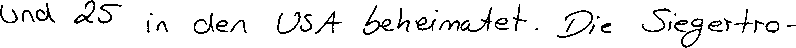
und 25 in den USA beheimatet. Die Siegertro-
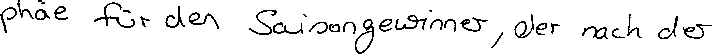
phäe für den Saisongewinner, der nach der
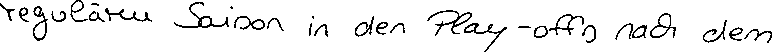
regulären Saison in den Play-offs nach dem
